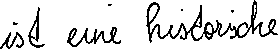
ist eine historische
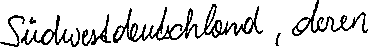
Südwestdeutschland, deren
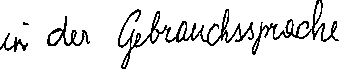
in der Gebrauchssprache
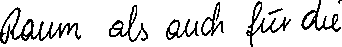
Raum als auch für die
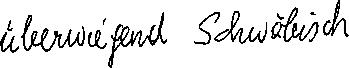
überwiegend Schwäbisch
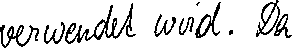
verwendet wird. Da
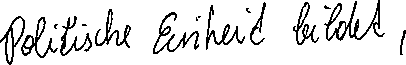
politische Einheit bildet,
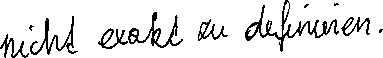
nicht exakt zu definieren.
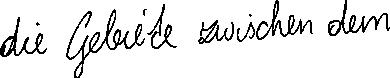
die Gebiete zwischen dem
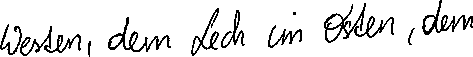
Westen, dem Lech im Osten, dem
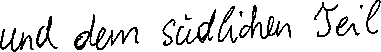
und dem südlichen Teil
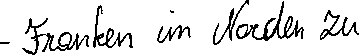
-Franken im Norden zu
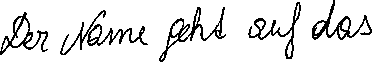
Der Name geht auf das
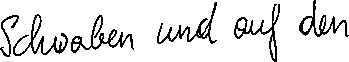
Schwaben und auf den
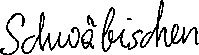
Schwäbischen
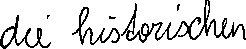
die historischen
